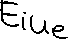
Eine
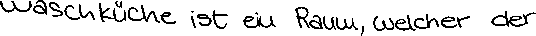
Eine Waschküche ist ein Raum, welcher der
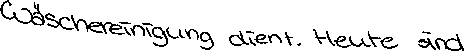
Wäschereinigung dient. Heute sind
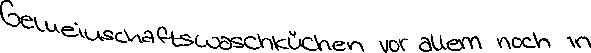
Gemeinschaftswaschküchen vor allem noch in
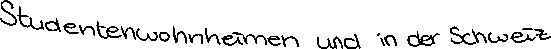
Studentenwohnheimen und in der Schweiz
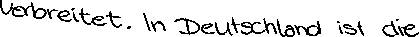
verbreitet. In Deutschland ist die
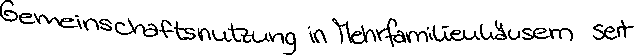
Gemeinschaftsnutzung in Mehrfamilienhäusern seit
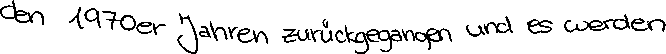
den 1970er Jahren zurückgegangen und es werden
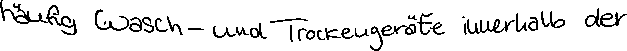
häufig Wasch- und Trockengeräte innerhalb der
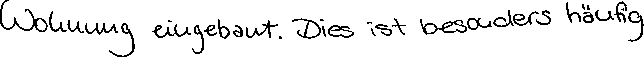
Wohnung eingebaut. Dies ist besonders häufig
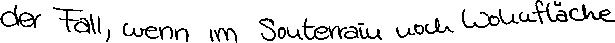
der Fall, wenn im Souterrain noch Wohnfläche
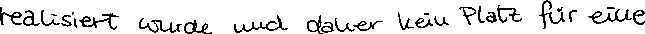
realisiert wurde und daher kein Platz für eine
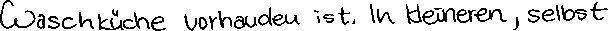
Waschküche vorhanden ist. In kleineren, selbst
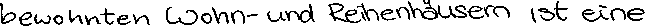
bewohnten Wohn-und Reihenhäusern ist eine
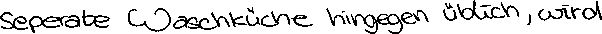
separate Waschküche hingegen üblich, wird
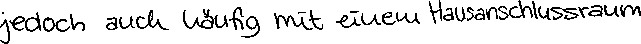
jedoch auch häufig mit einem Hausanschlussraum
